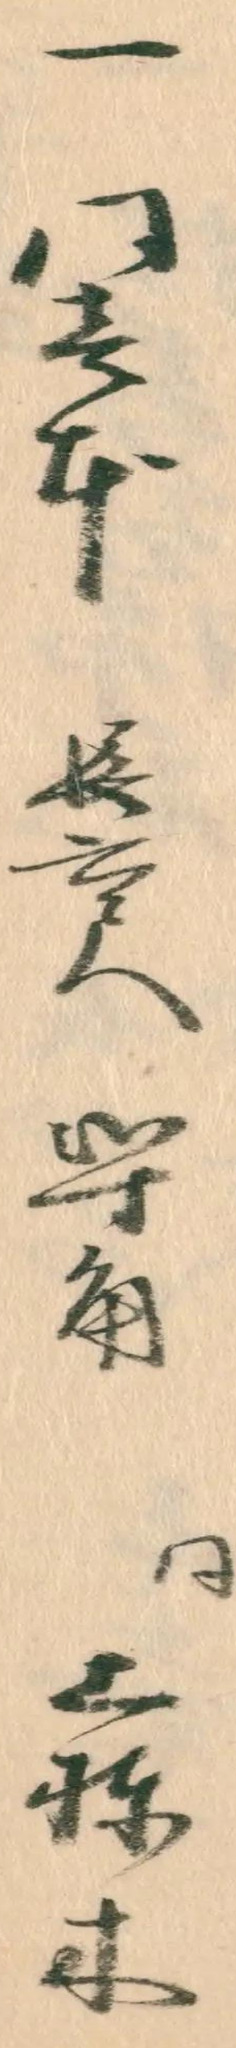一同壱本長六尺弐寸角同上棟木
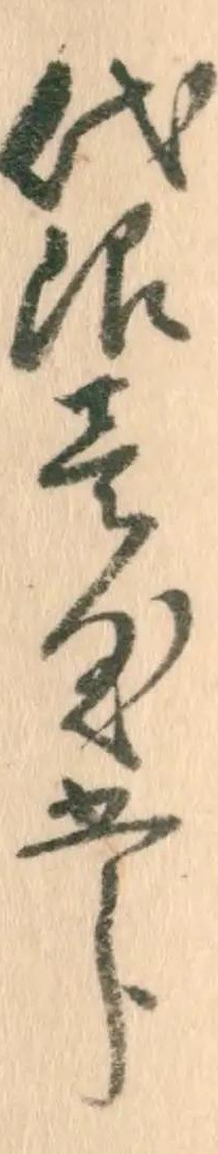代銀壱匁五分
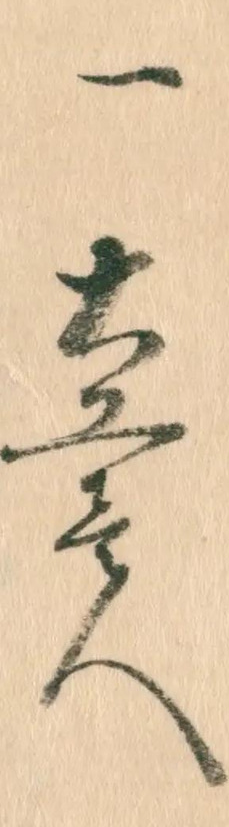一大工壱人
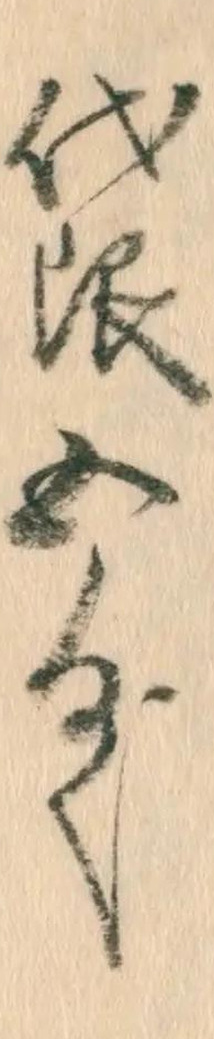代銀五匁
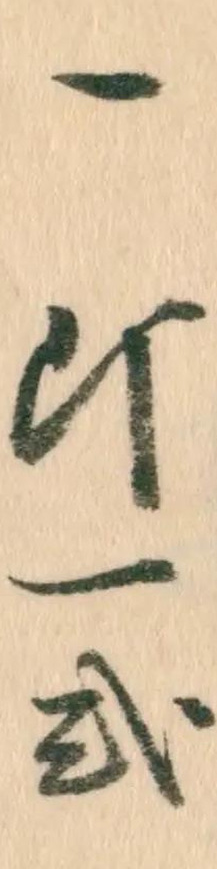一釘一式
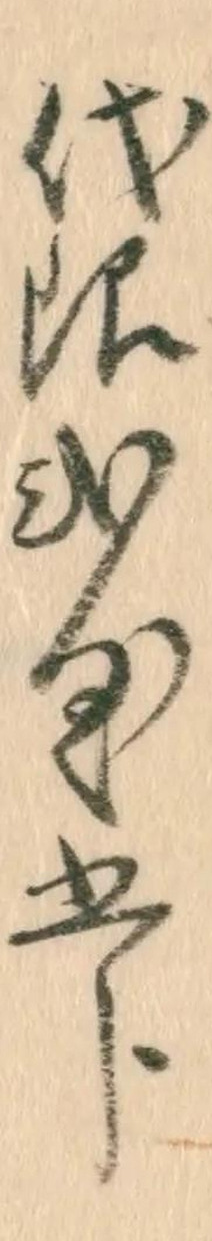代銀弐匁五分
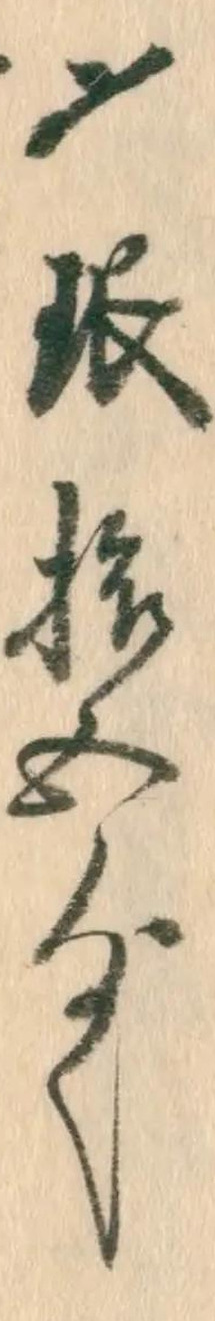〆銀拾五匁
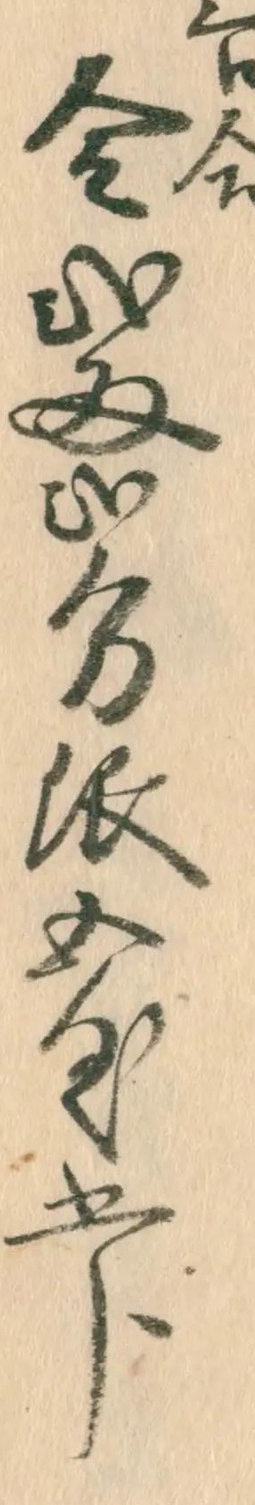金弐両弐分銀五匁五分

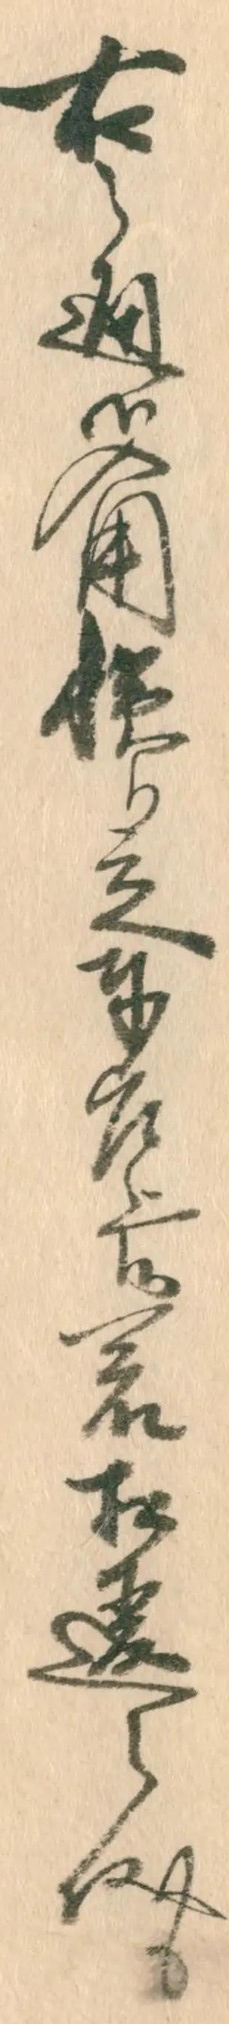右之通御入用積り立奉差上候若相違之儀も
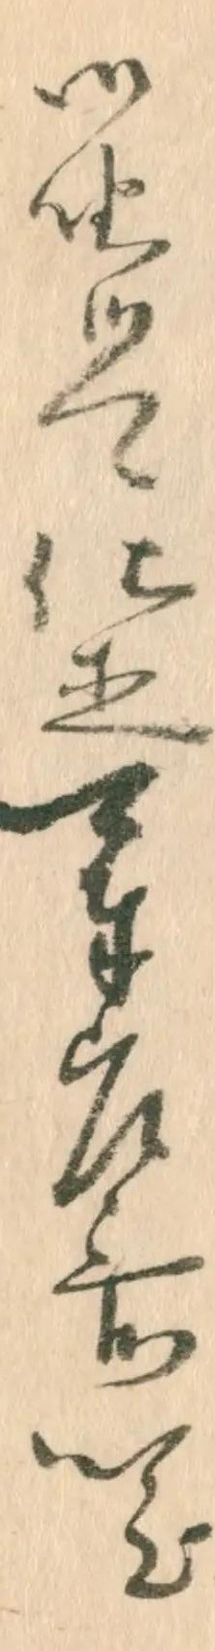御座候ハヽ仕直可奉差上候以上
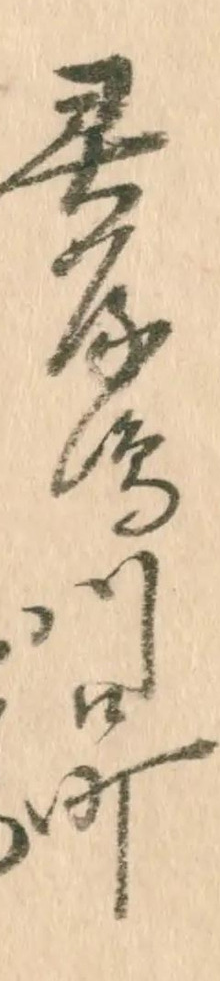霊岸島川口町
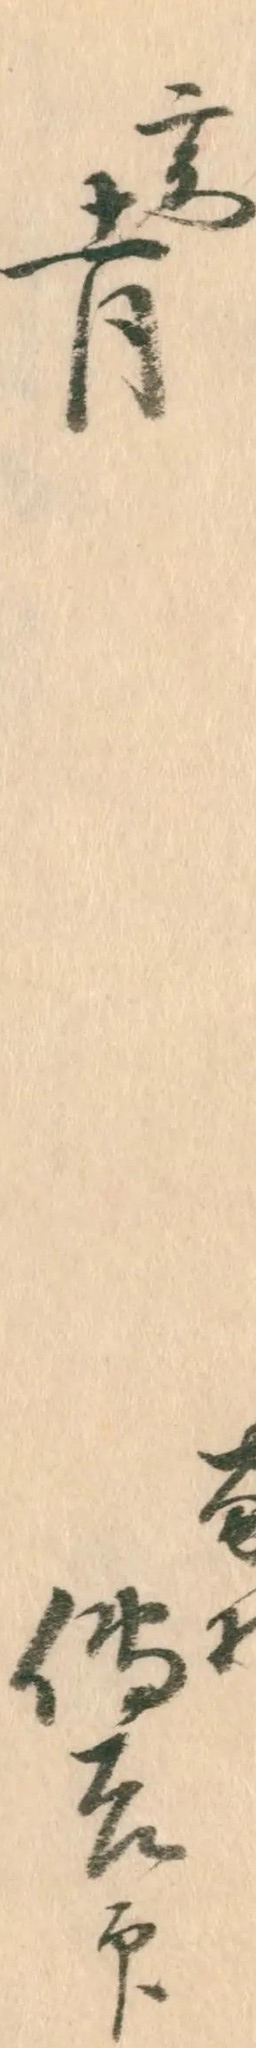亥十一月伝吉印
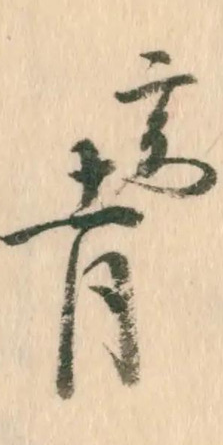亥十一月
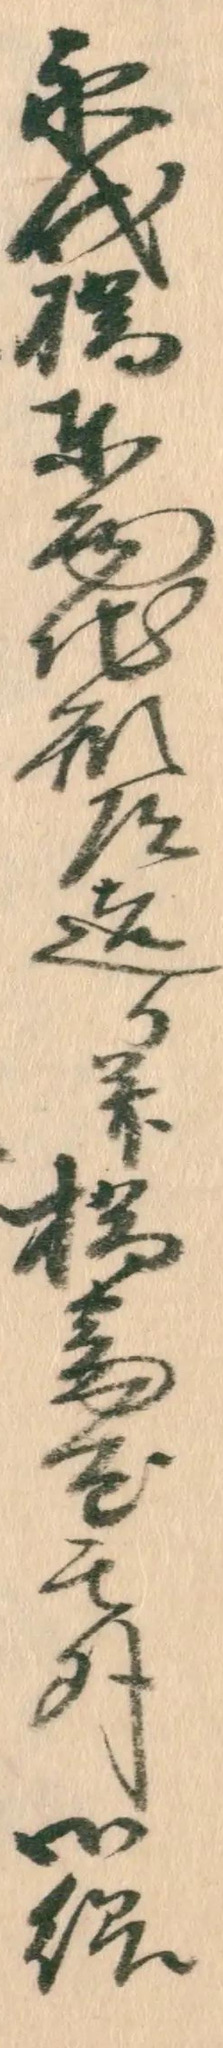永代橋東西地形道造り并橋番屋其外御繕
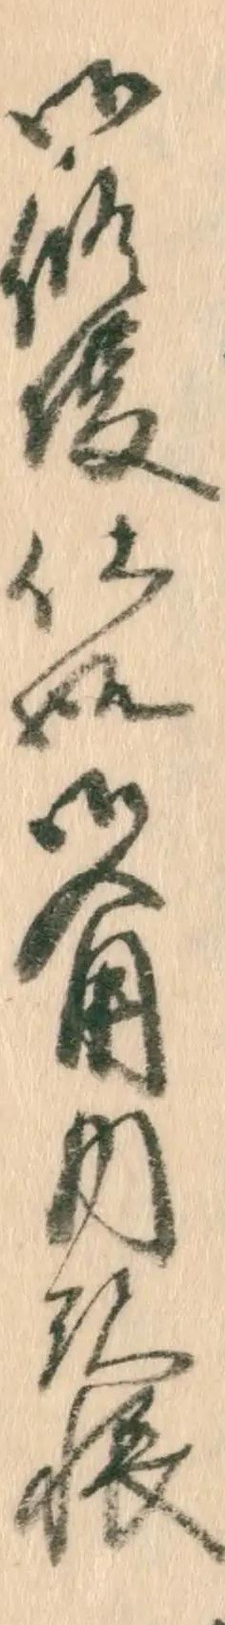御修復仕様御入用内訳帳
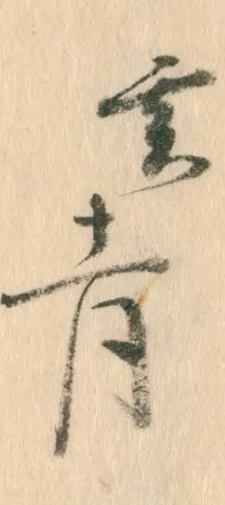亥十一月
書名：三橋 17巻. [7] 三橋小破御修復書留　但御奉行御掛リ替地震潰橋番屋　嘉永四亥年より安政二卯年迄　上
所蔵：国立国会図書館 National Diet Library, JAPAN
